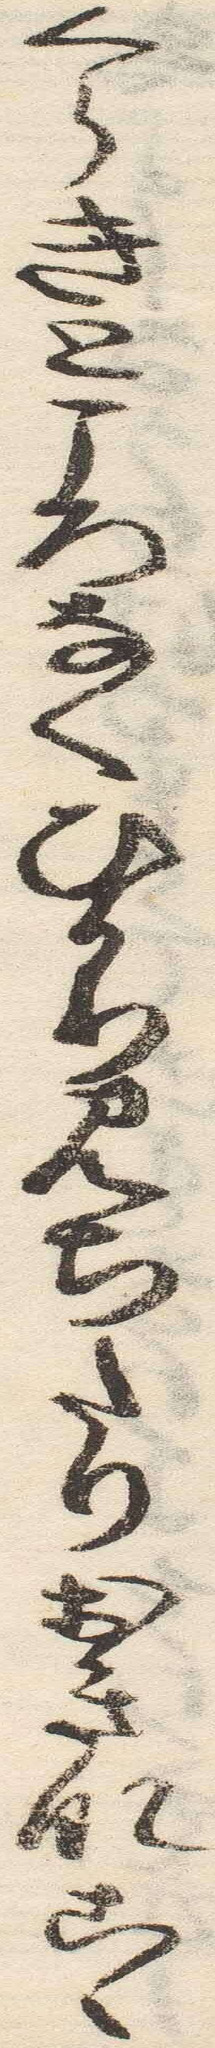くらきところなくひかりみちたりおきなこゝ
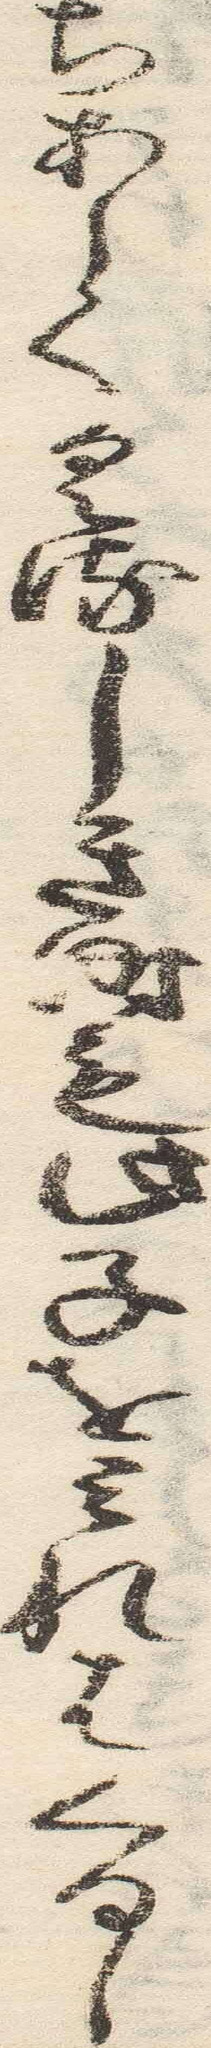ちあしくくるしき時も此子をみれはくるし
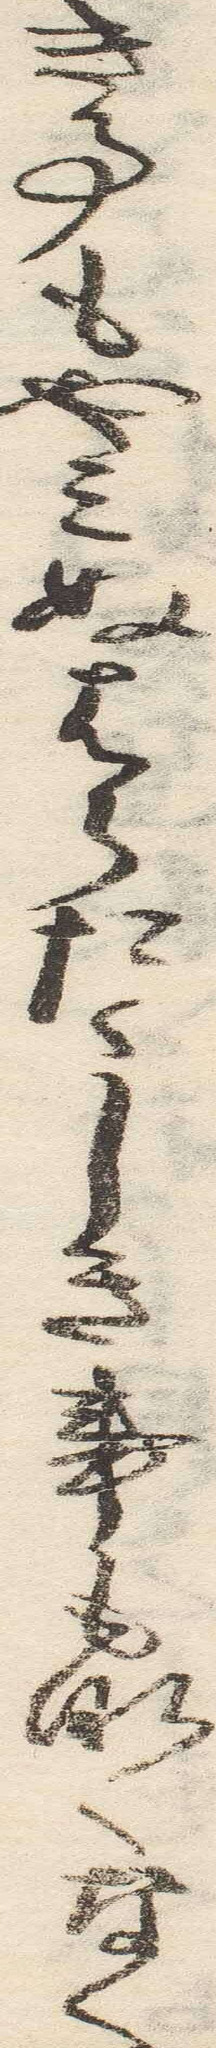き事もやみぬはらたゝしき事もなくなく
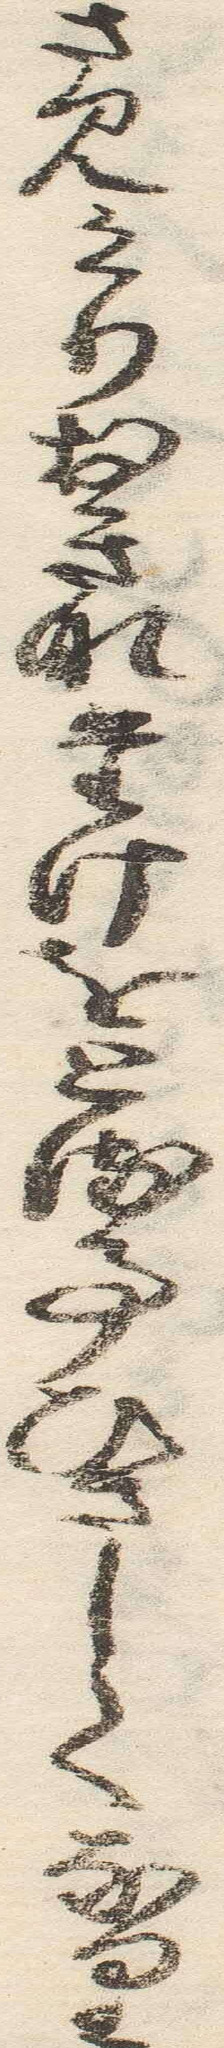さみけりおきなたけをとる事ひさしくなり
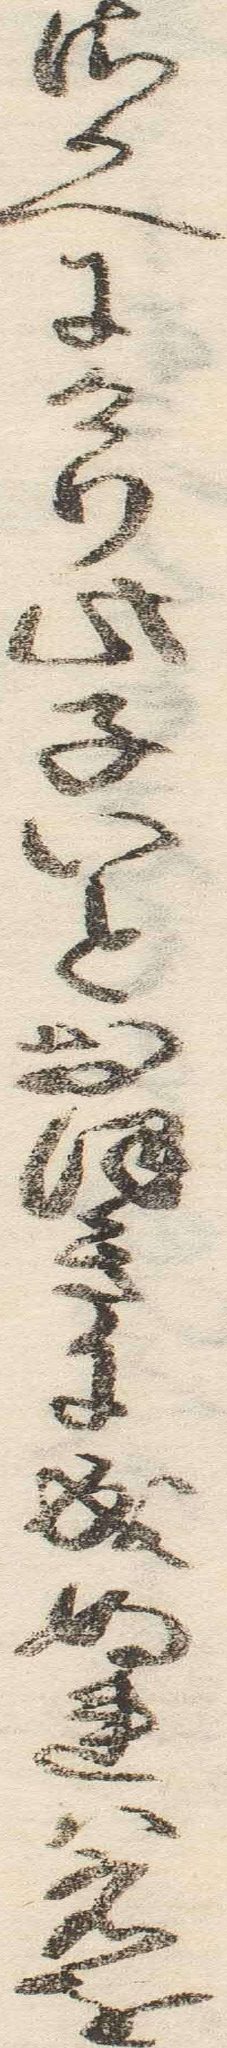さかへにけり此子いとおほきに成ぬれは名を
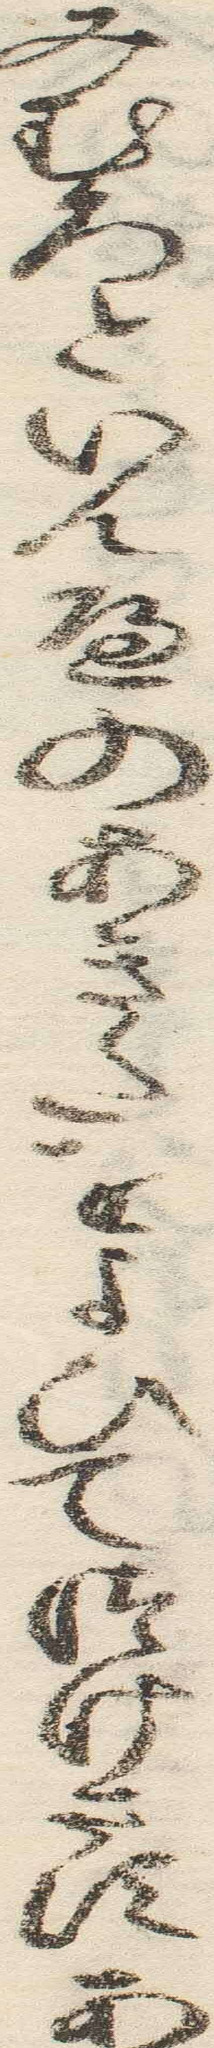みむろといんへのあきたをよひてつけさすあ
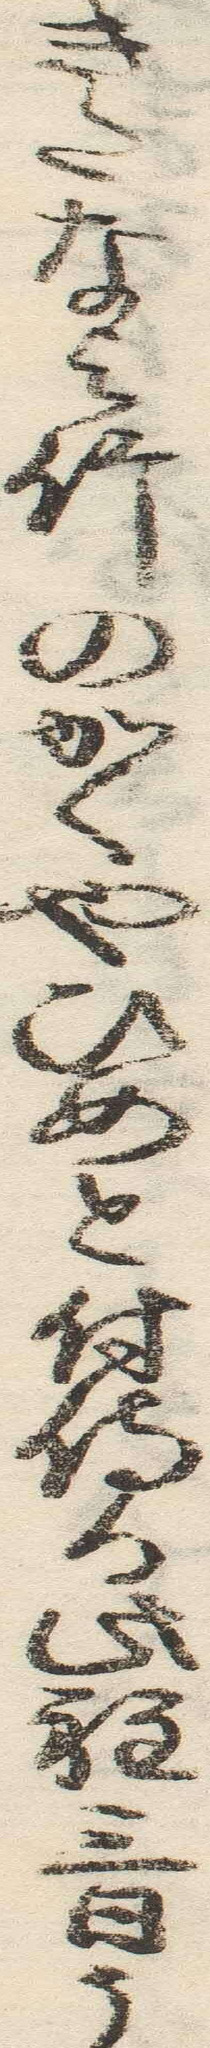きたなよ竹のかくやひめと付侍る此程三日う
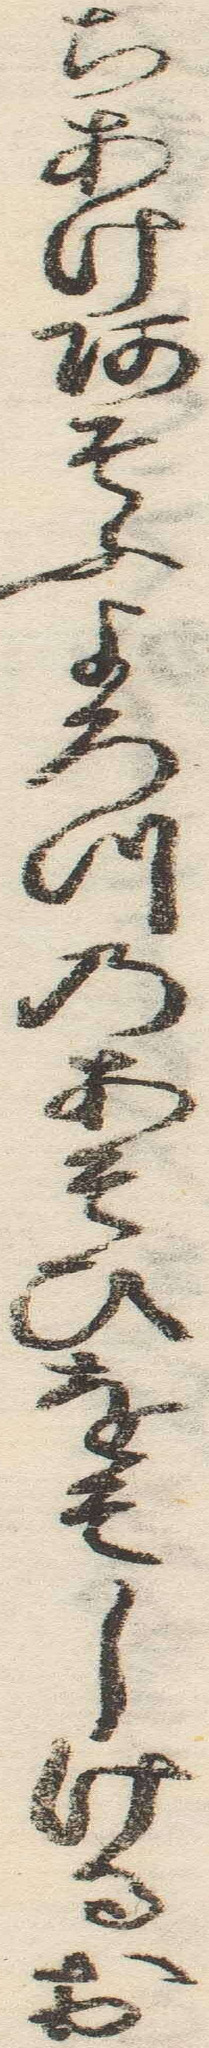ちあけあそふよろつのあそひをそしけるお
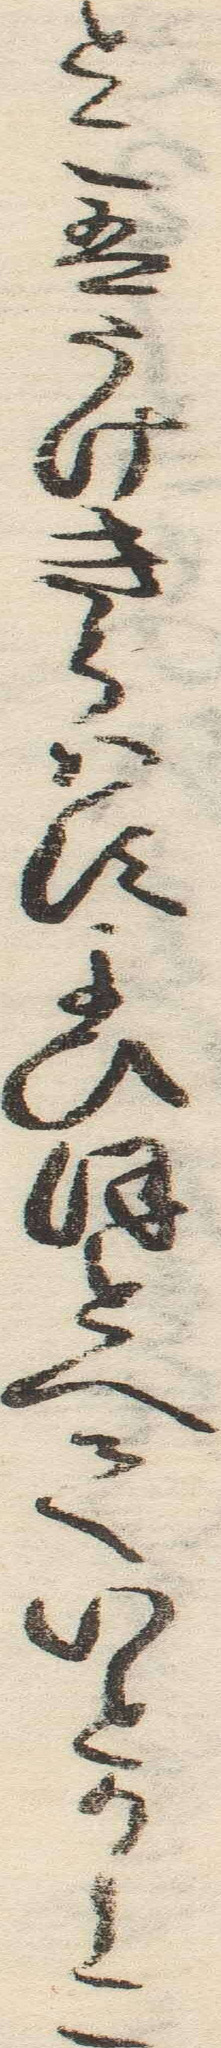とこはうけきらはすよひつとへていとかしこ
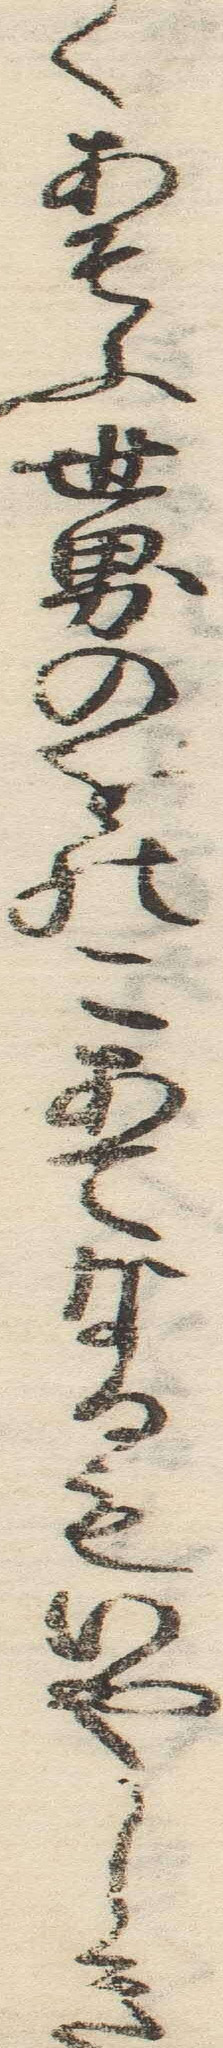くあそふ世界のをのこあてなるもいやしき
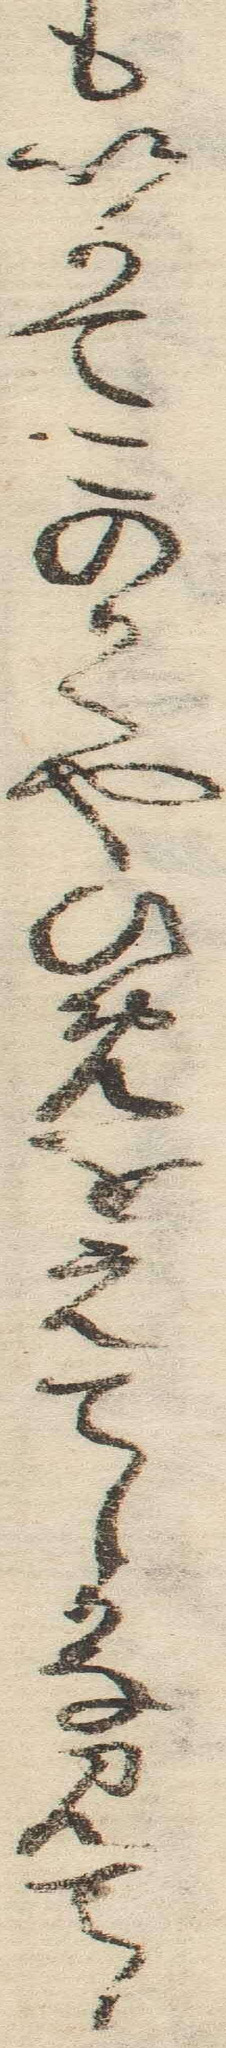もいりてこのかくやひめをえてしかな見てし

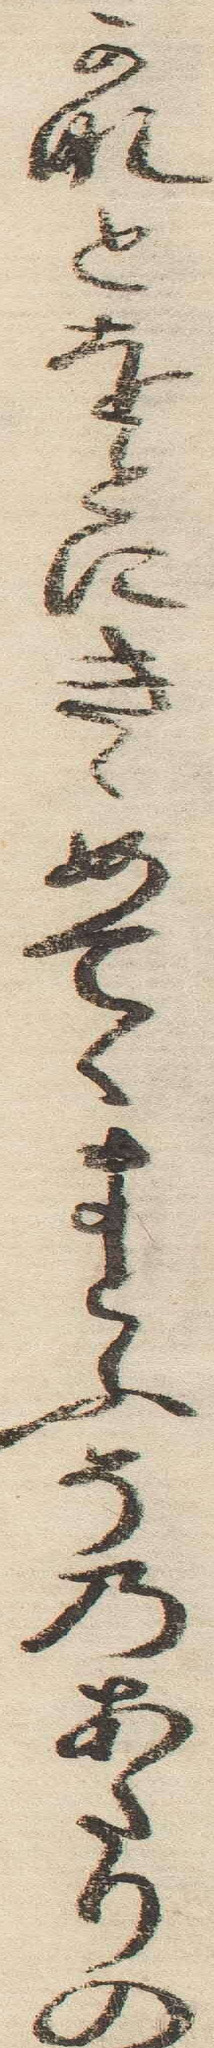かなとをとにきゝめてゝまとふそのあたりの
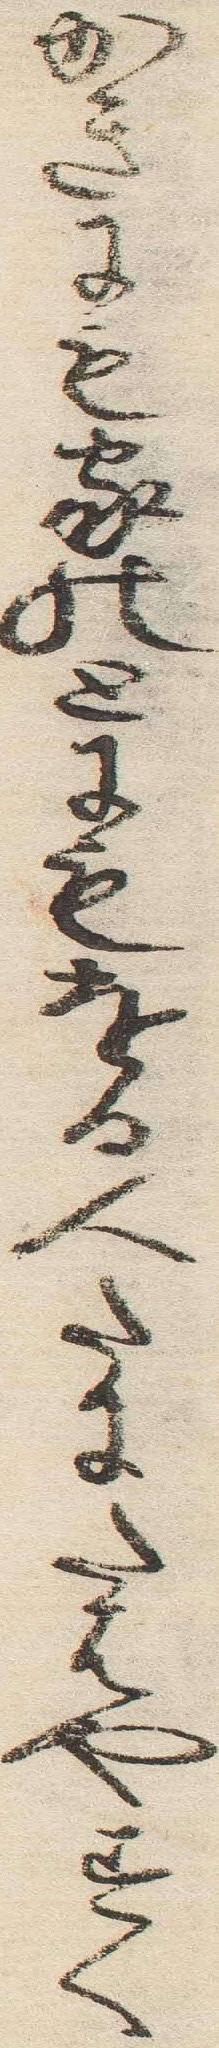かきにも家のとにもをる人たにたはやすく
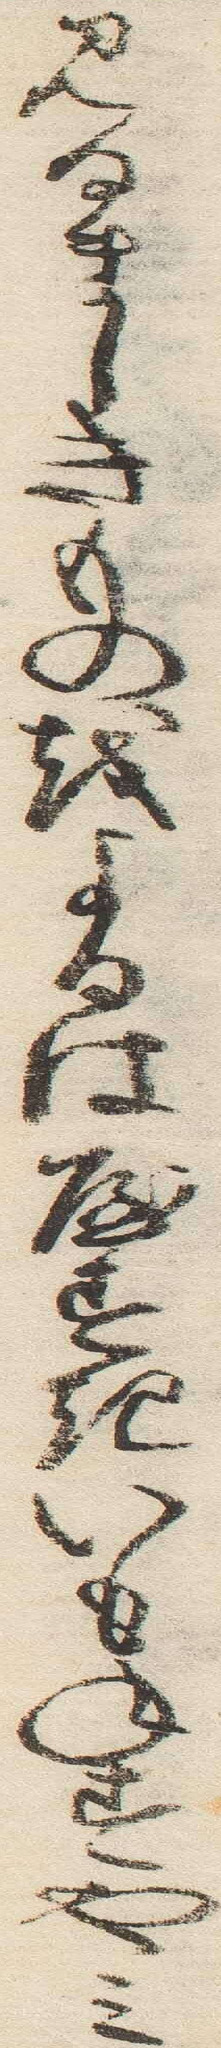見るましきものをよるはやすきいもねすやみ
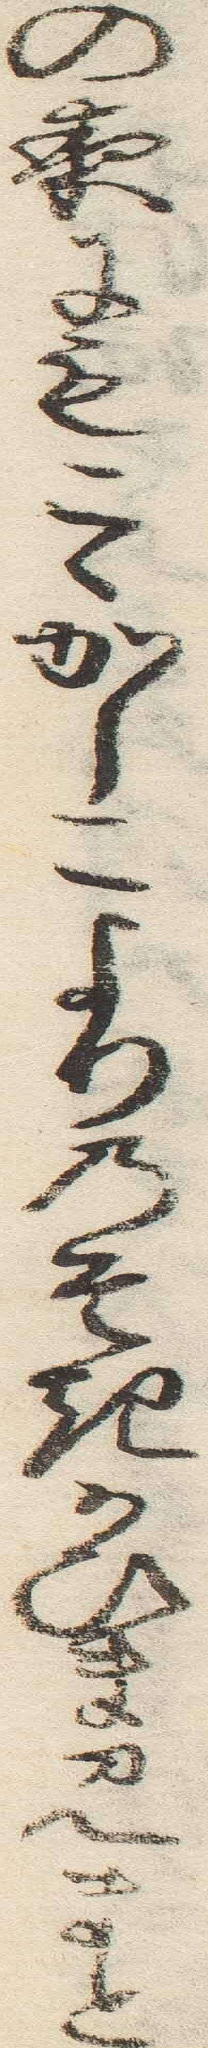の夜にもこゝかしこよりのそきかひま見まと
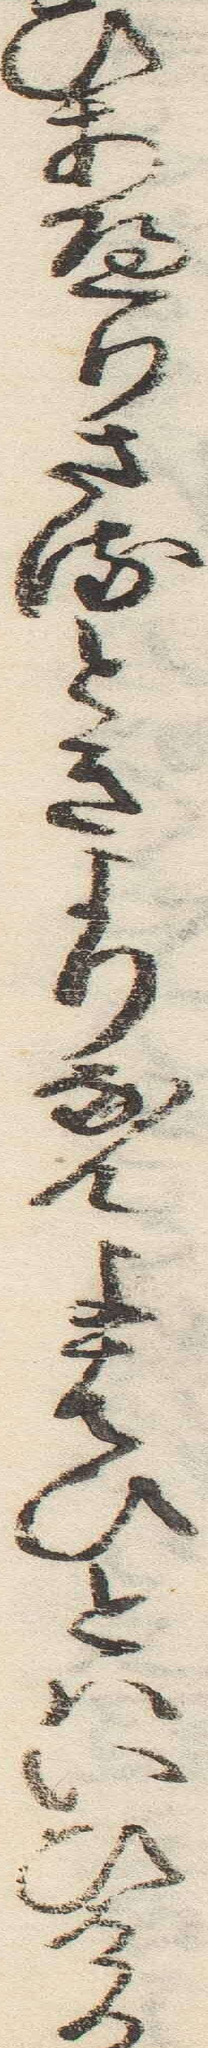ひあへりさるときよりなんよはひとはいひける
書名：竹取物語
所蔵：東京学芸大学附属図書館 国文学研究資料館
